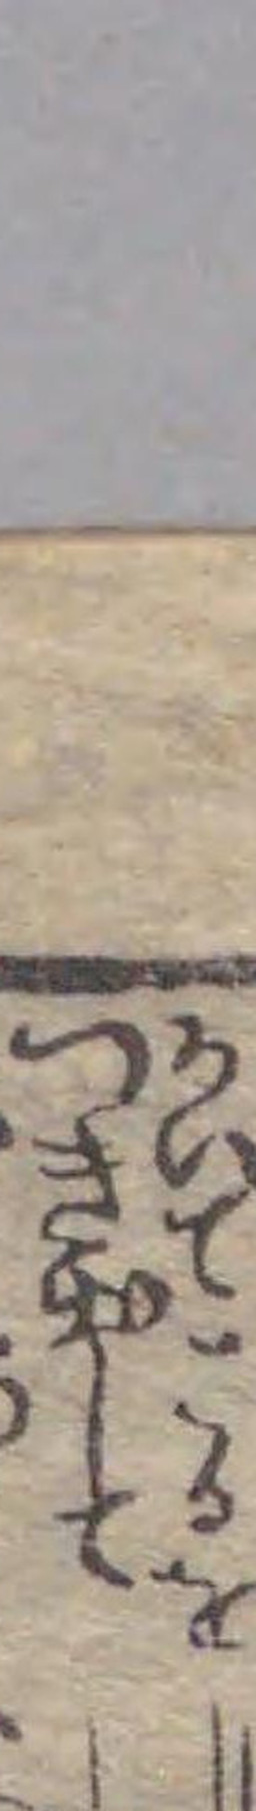つき出して
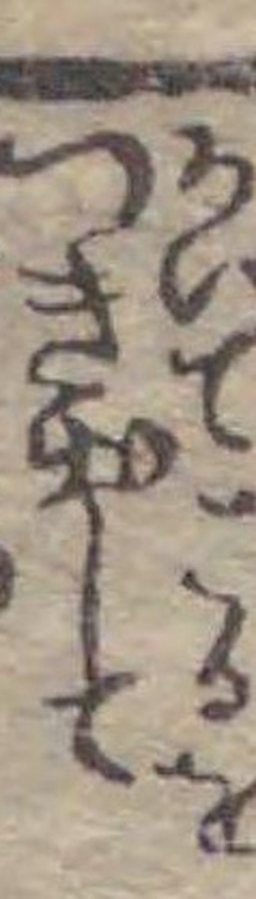つき出して
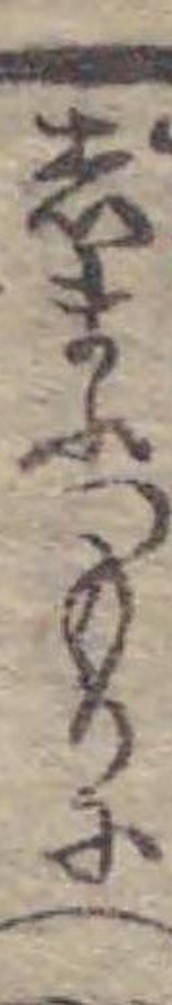しまふつもりに
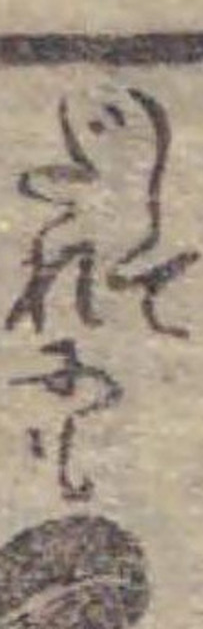だれにも
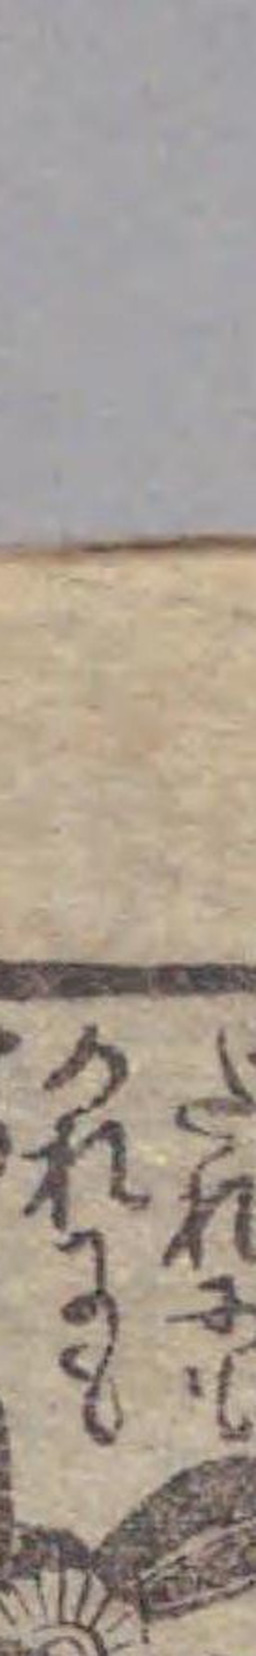かれにも
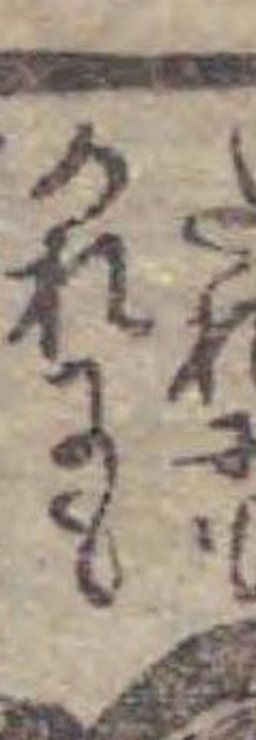かれにも
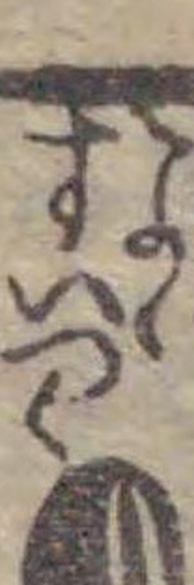すいつく
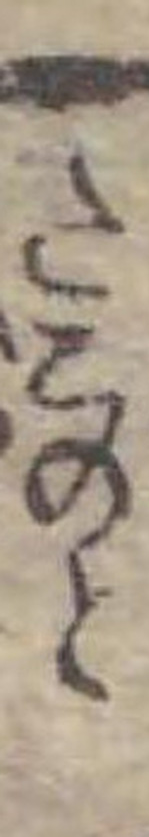たこのと
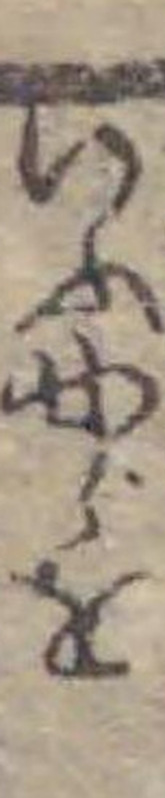いふ女郎を
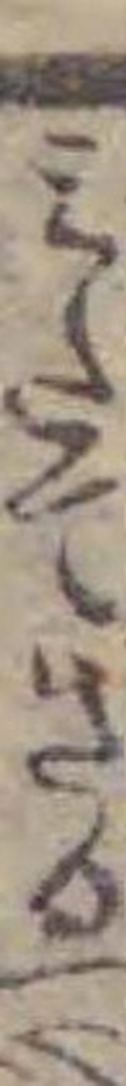みたてさる
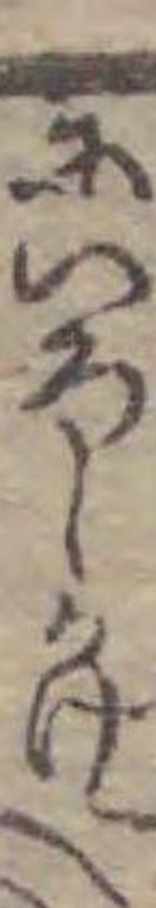にいろしかけ
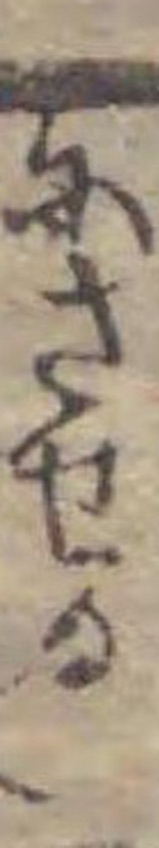にさせる
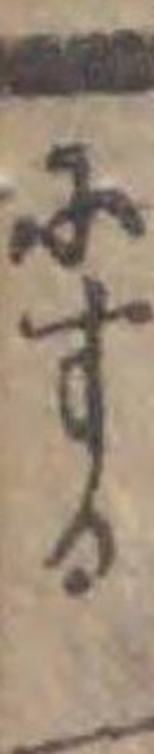にする

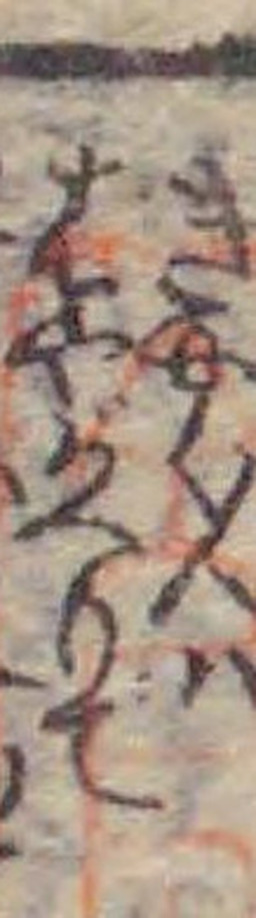はやがへりで
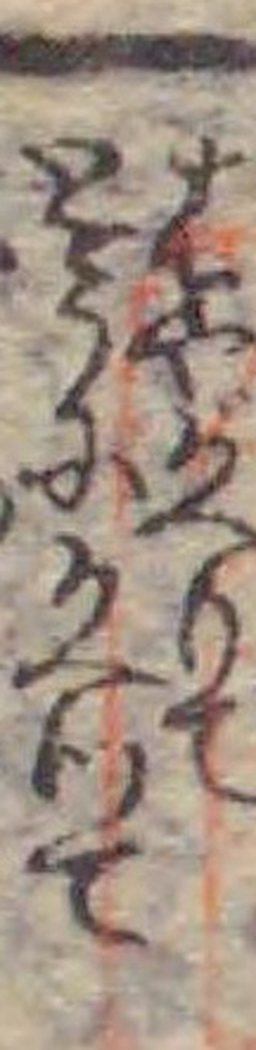とうにかへつて
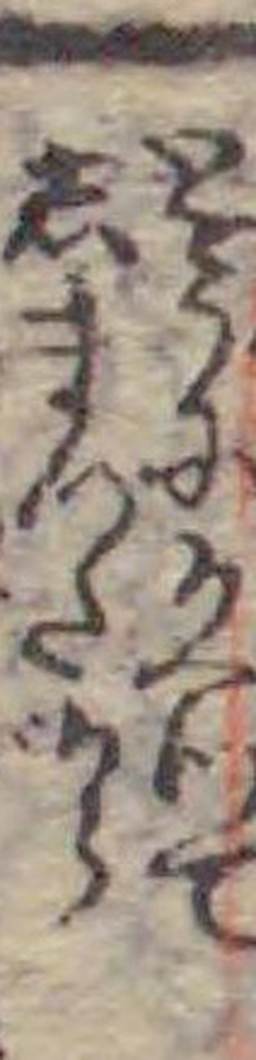しまつたから
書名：竜宮苦界玉手箱 : 3巻
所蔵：国立国会図書館 National Diet Library, JAPAN
